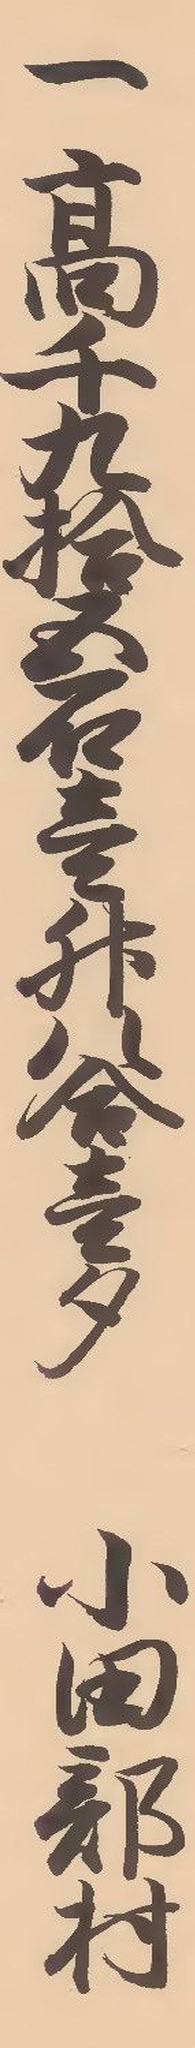一高千九拾五石壱升八合壱勺小田部村
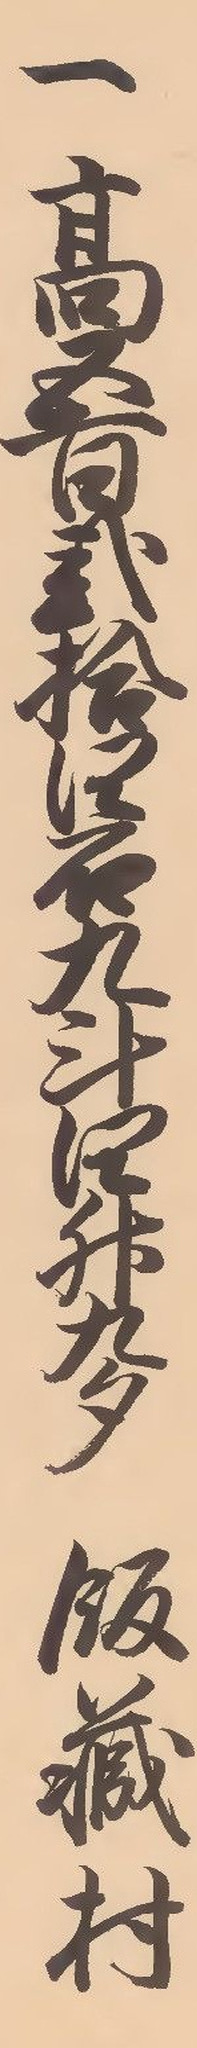一高五百弐拾四石九斗四升九勺飯蔵村
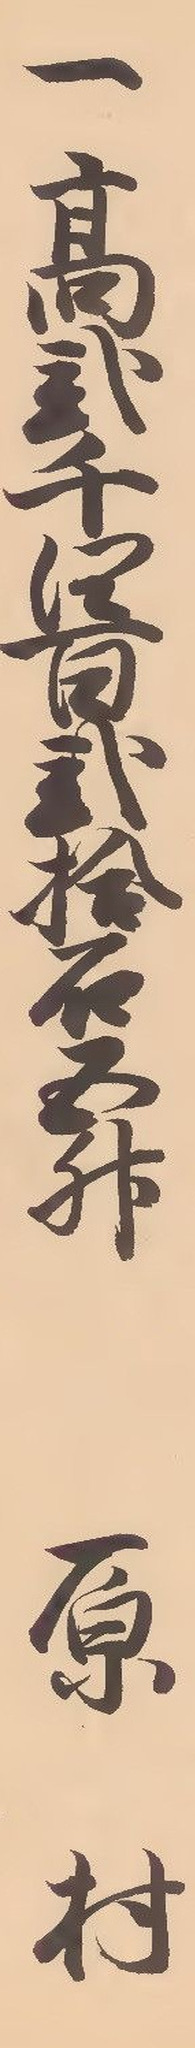一高弐千四百弐拾石五升原村

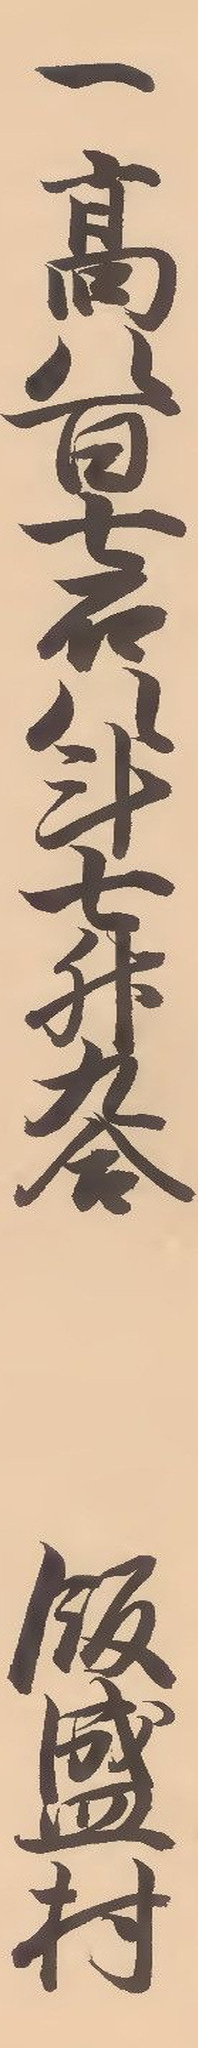一高八百七石八斗七升九合飯盛村
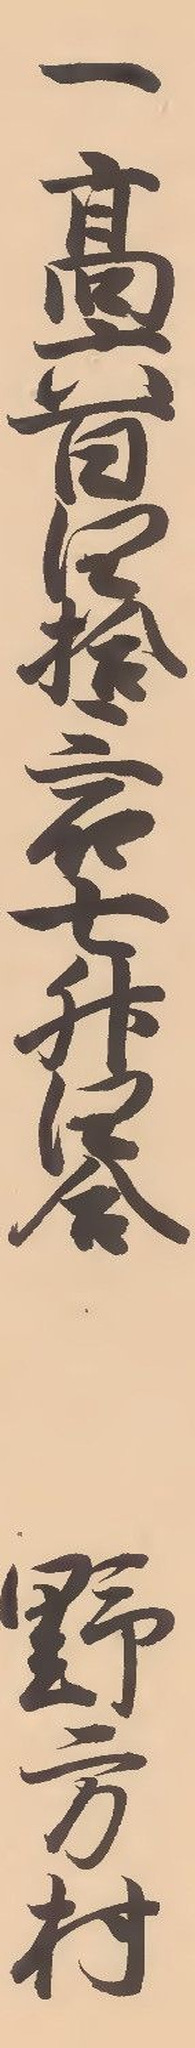一高六百四拾三石七升四合野方村
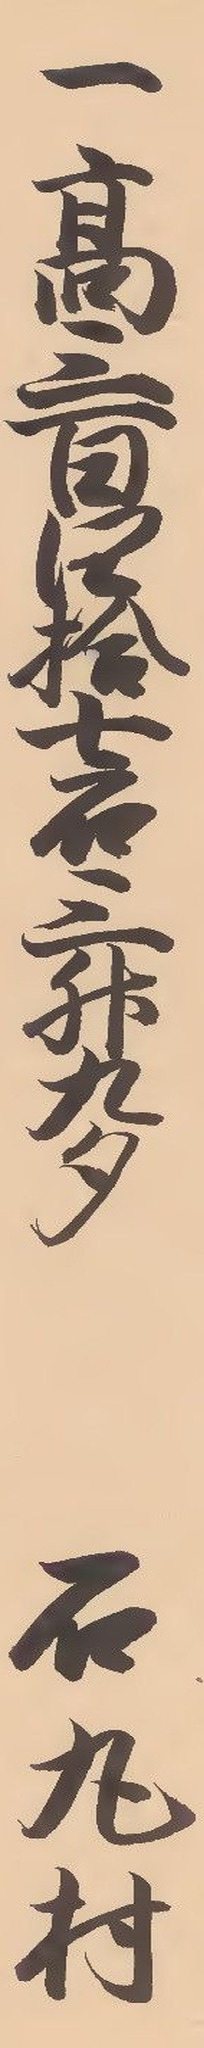一高三百四拾七石三升九勺石丸村
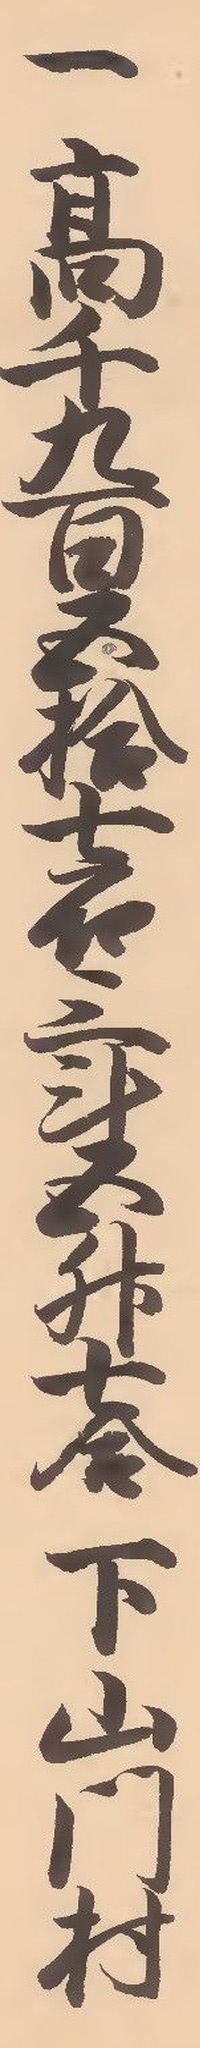一高千九百五拾七右三斗五升七合下山門村
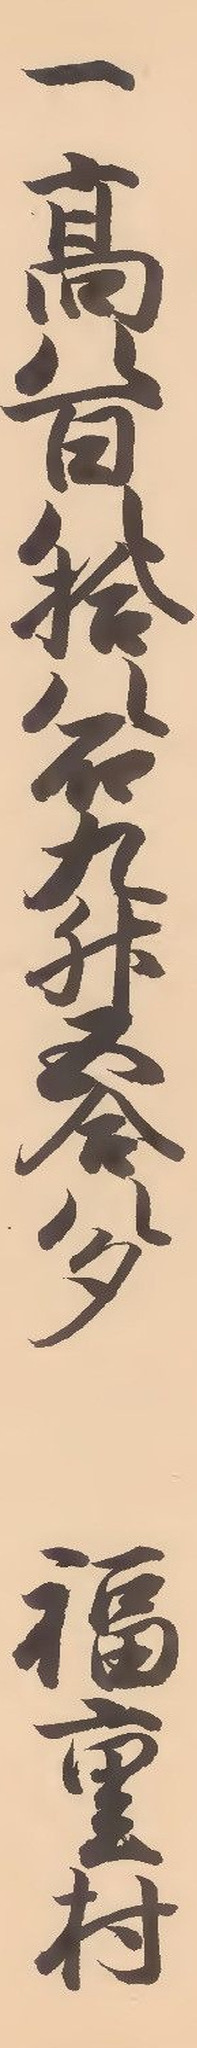一高八百八拾八石九升五合八勺福重村
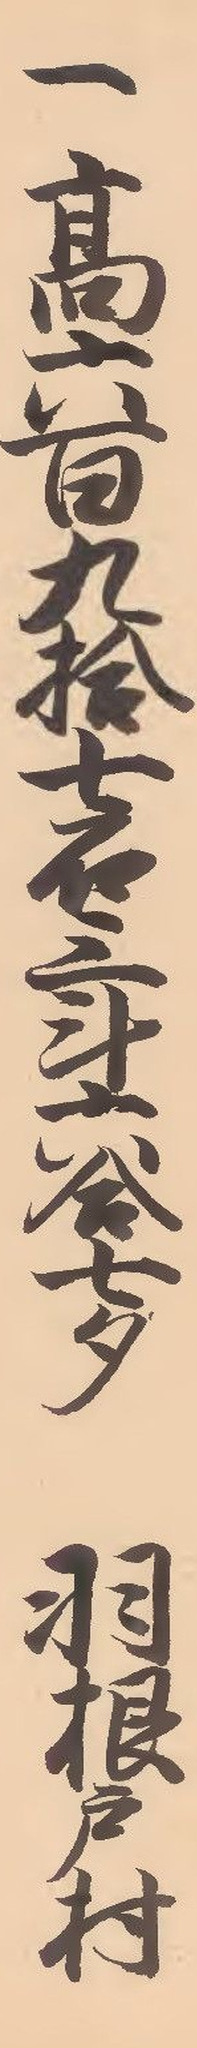一高六百九拾七石三斗六合七勺羽根戸村

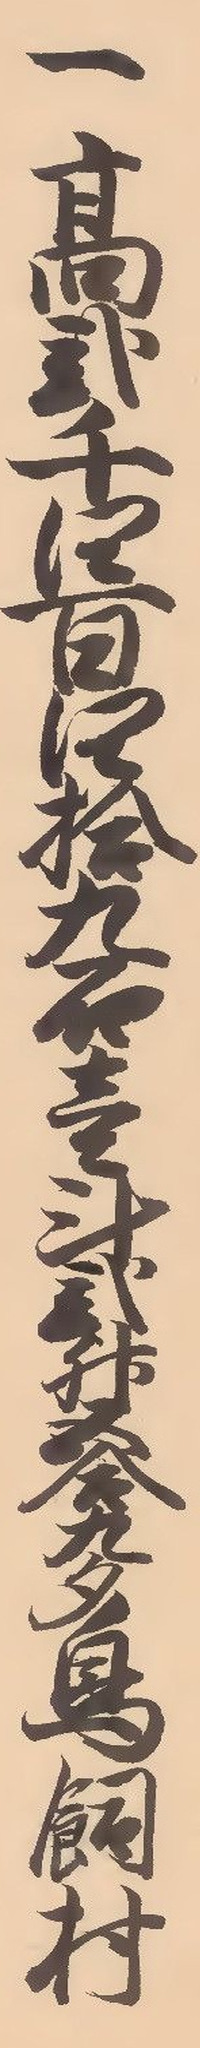一高弐千四百四拾九石壱斗弐升五合九勺鳥飼村
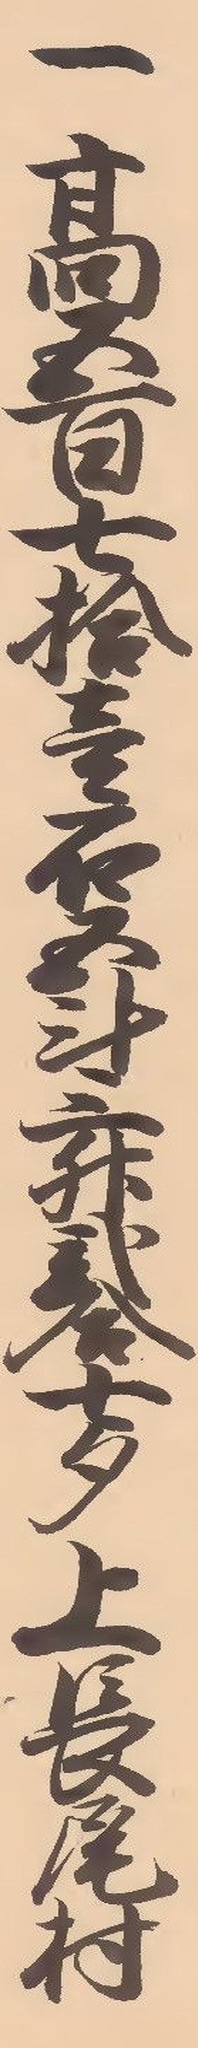一高五百七拾壱石五斗三升弐合七勺上長尾村
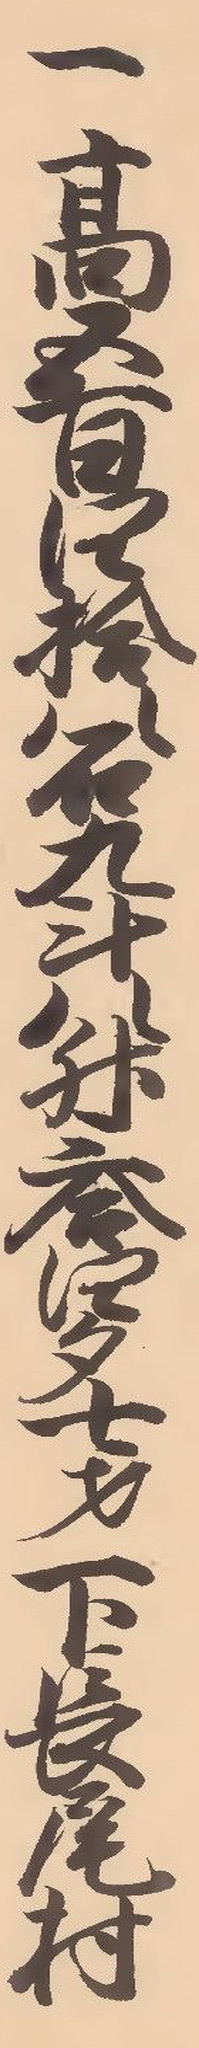一高五百四拾八石九斗八升三合四勺七才下長尾村
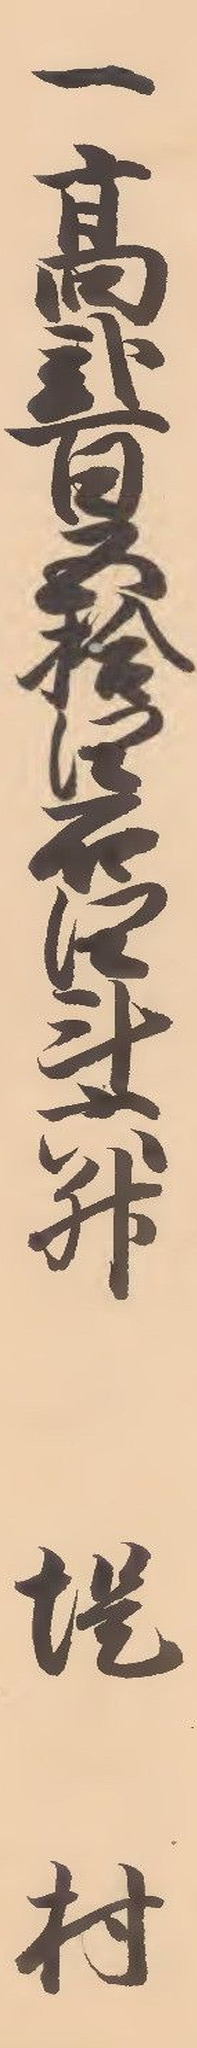一高弐百五拾四石四斗六升堤村
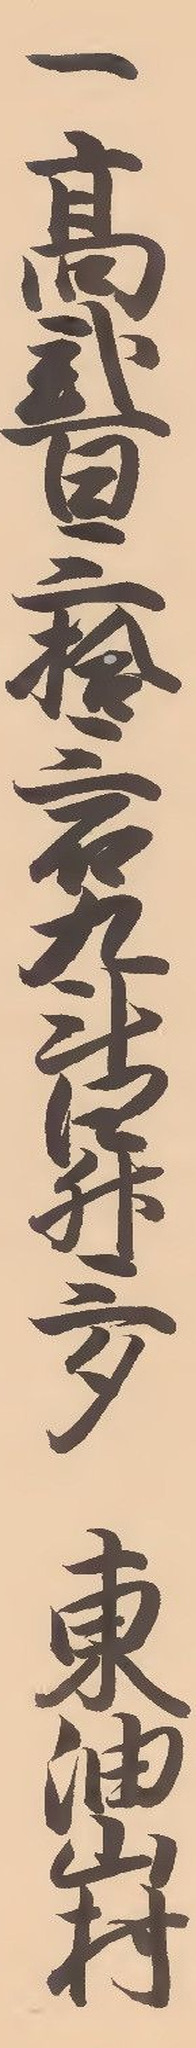一高弐百三拾三石九斗四升三勺東油山村
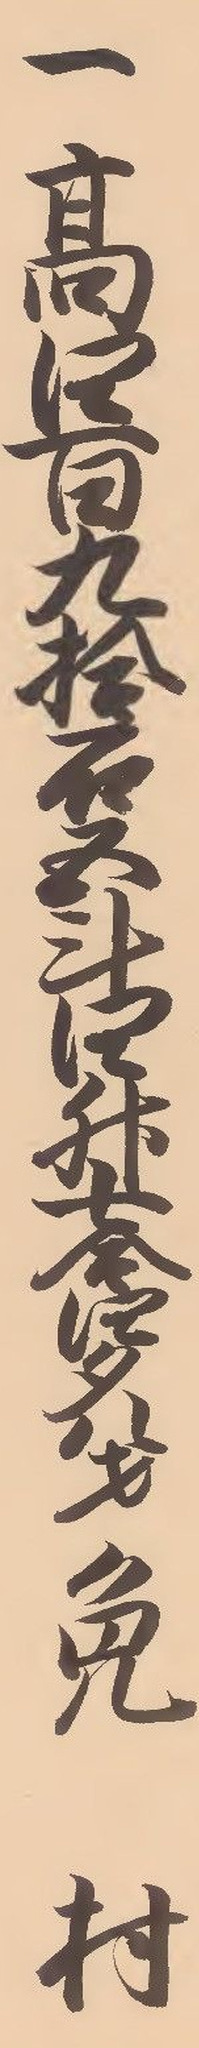一高四百九拾石五斗四升七合四勺八才免村
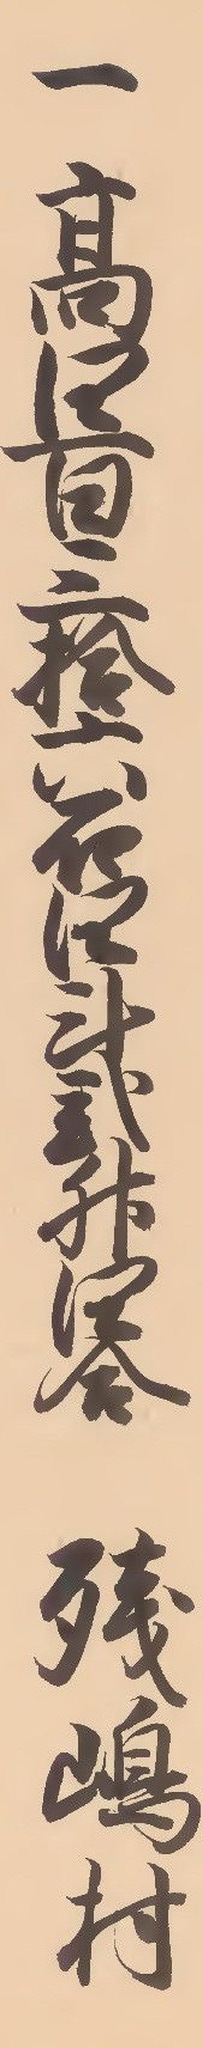一高四百三拾六石四斗弐升四合残島村
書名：筑前国郷帳
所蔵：国立公文書館 National Archives of Japan
